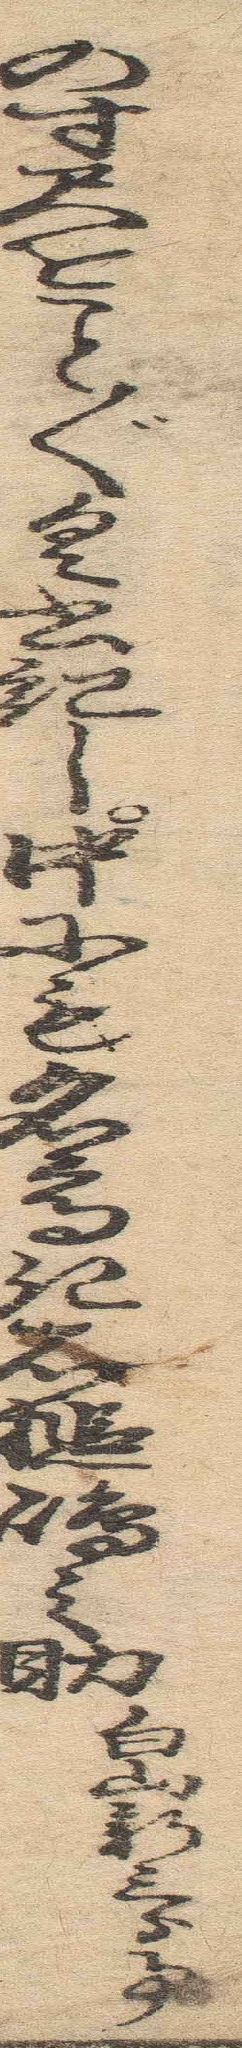の寸尺をこと〴〵く書記し。中にも名髙き石槌嶋之助白山新三郎事
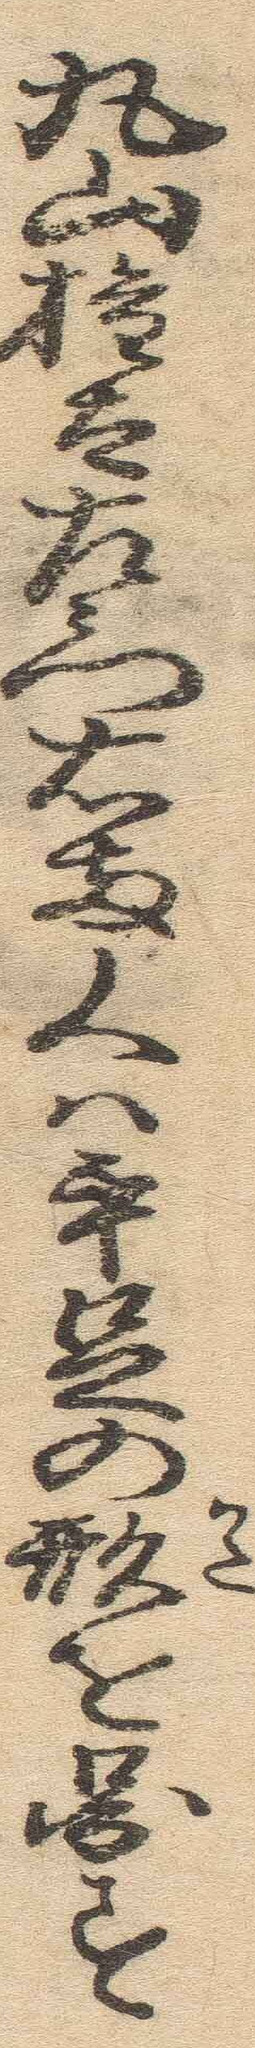丸山権太左衛門右両人は手足の形を図す
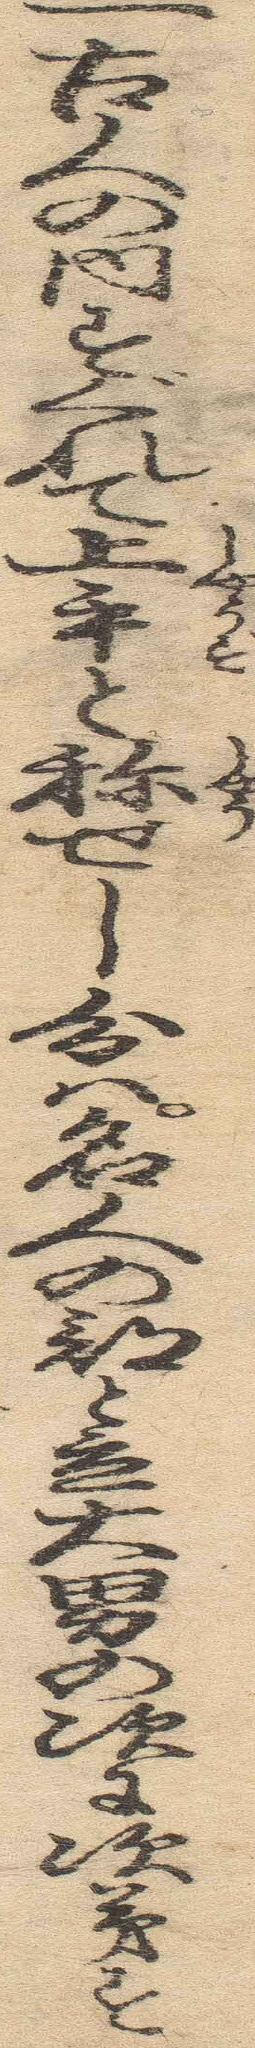一古人の内すぐれて上手と称せし分は。名人の部と立大男の次に次第す
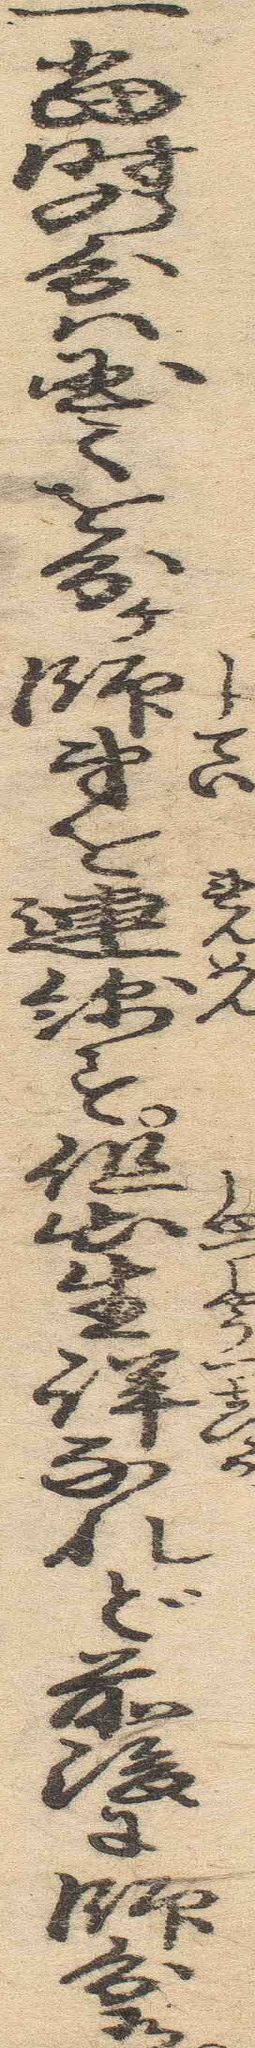一当時の分は国々を分師弟を連綿す。但出生詳なれど前後に師分有。
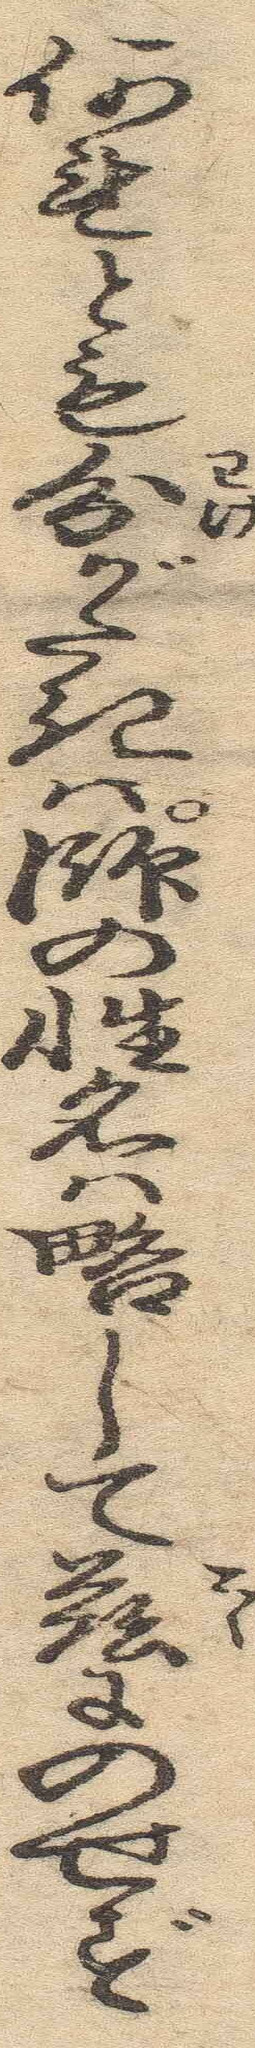あれとも分がたきは。師の性名は略して茲にのせず
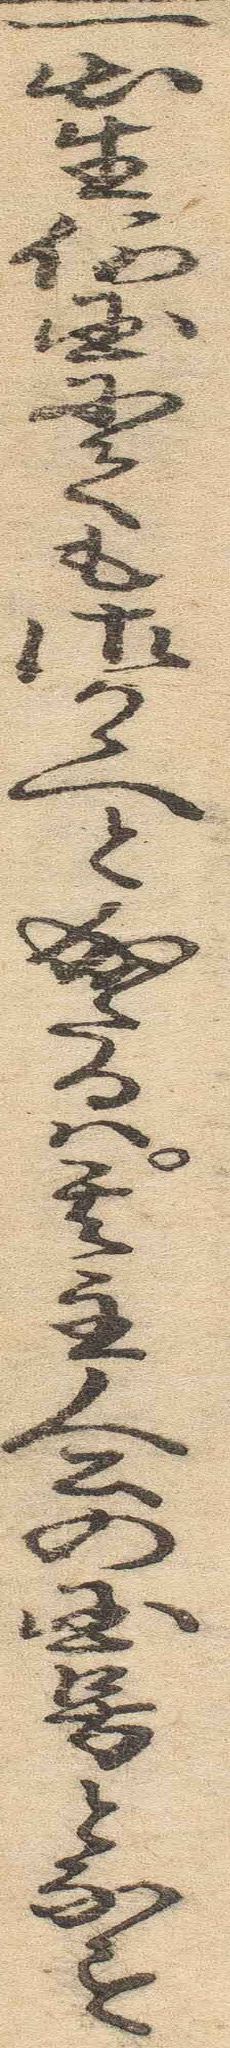一出生何国にても御かゝへと成たるは。其主人公の国号となす
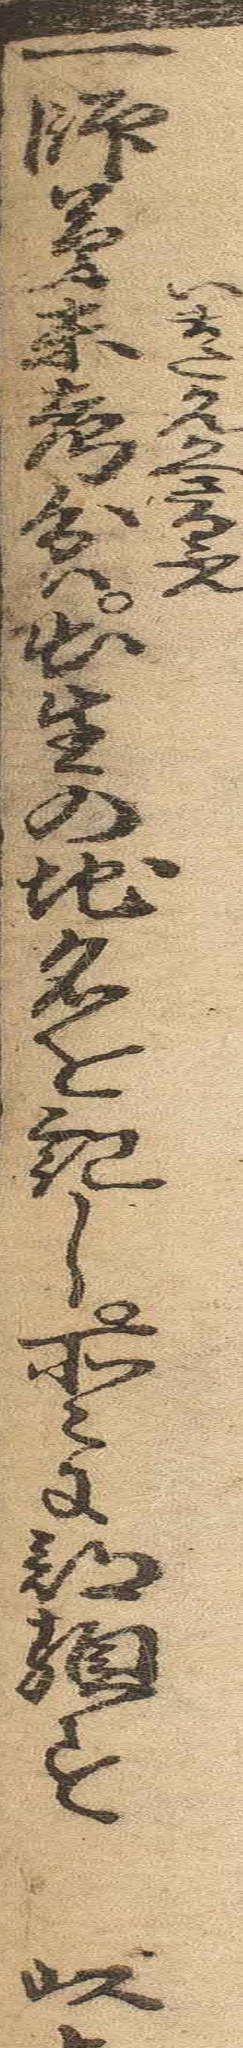一師弟未考分は。出生の地名を記し。所々に部類す以上
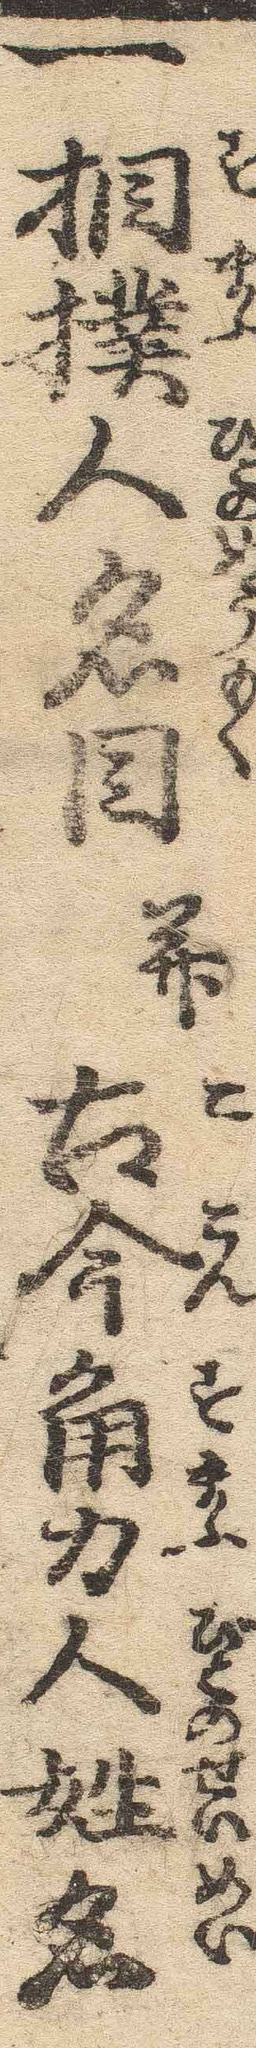一相撲人名目并古今角力人姓名
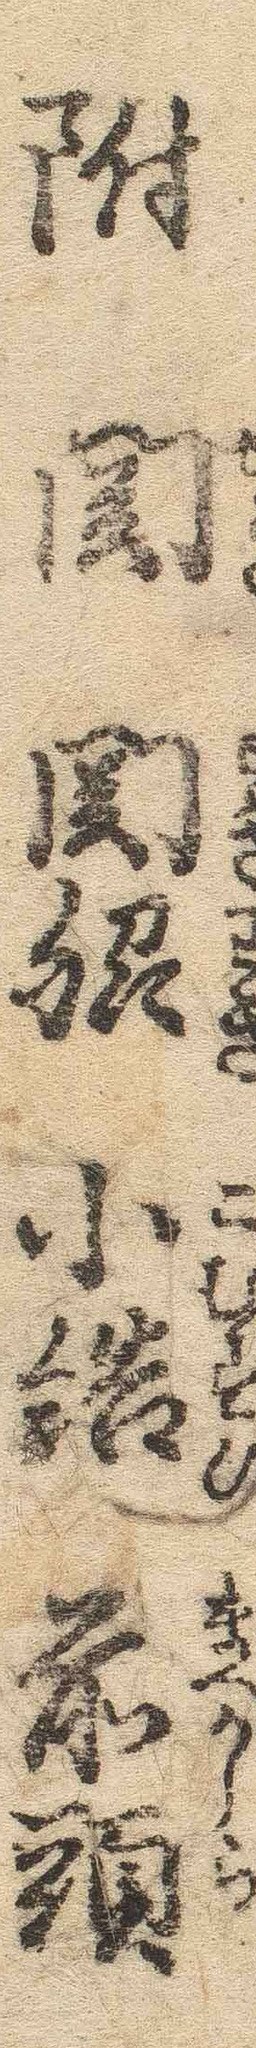附関関脇小結前頭
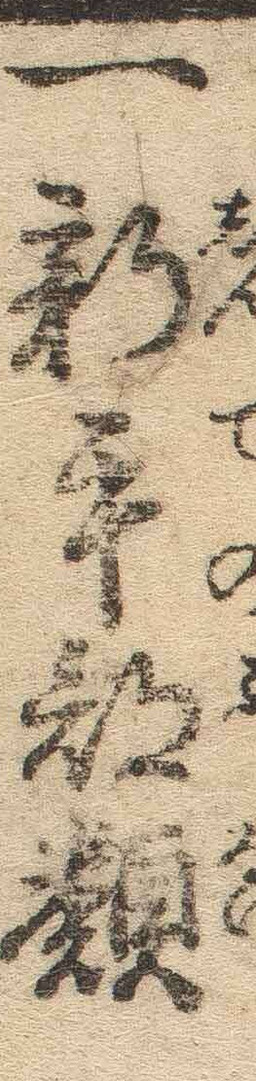一新手部類
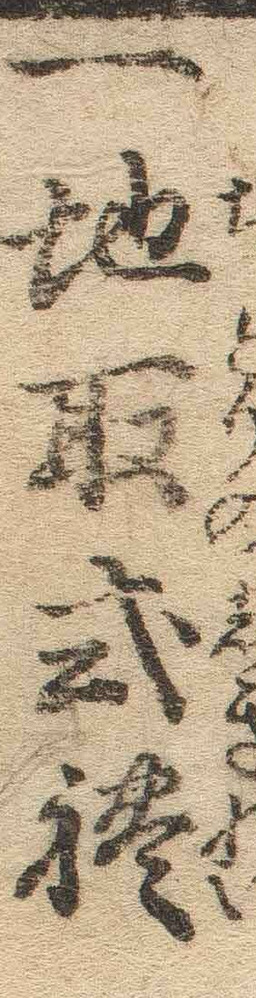一地取式禮
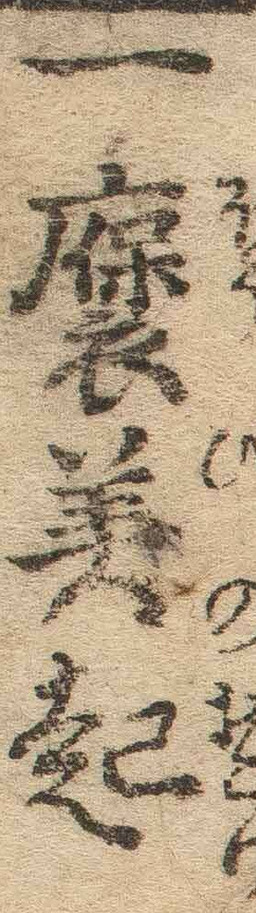一褒美起
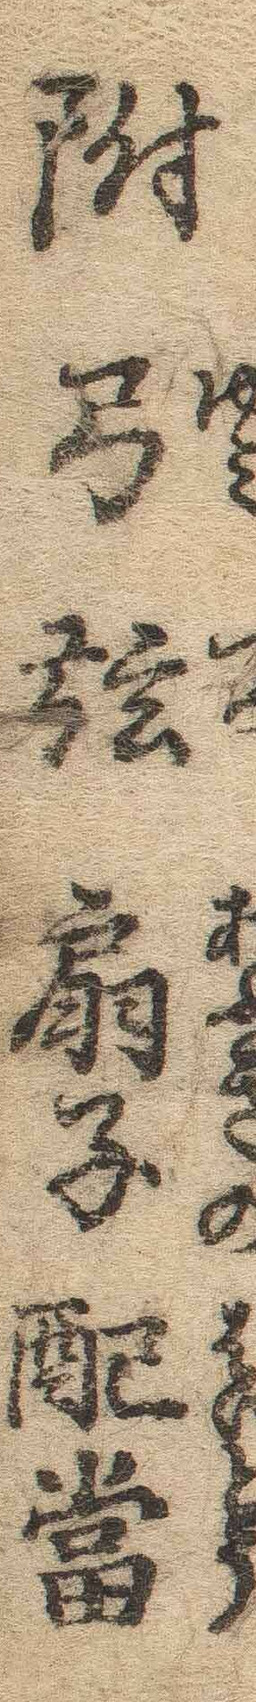附弓弦扇子配当

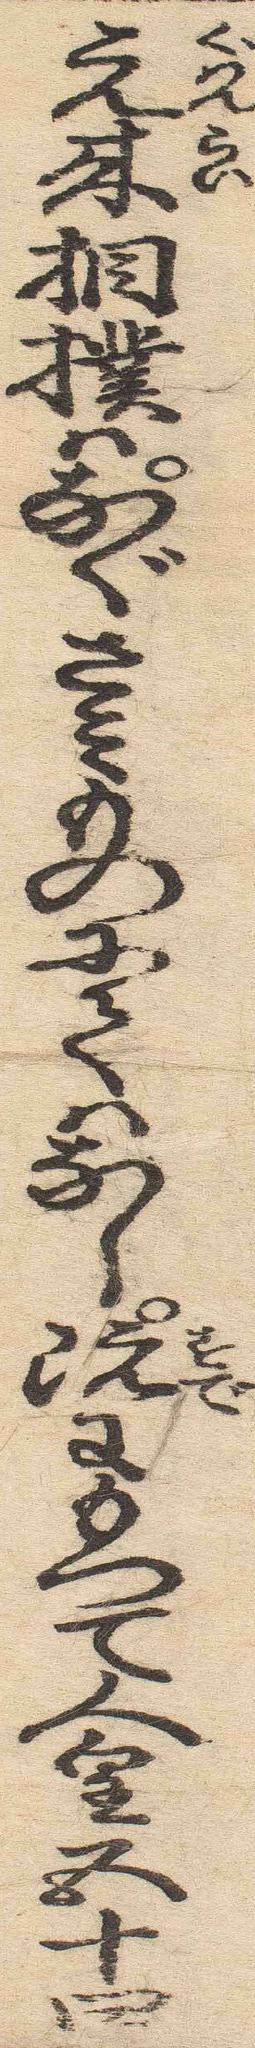元来相撲は。なぐさみものにてはなし。既にもつて人皇五十四
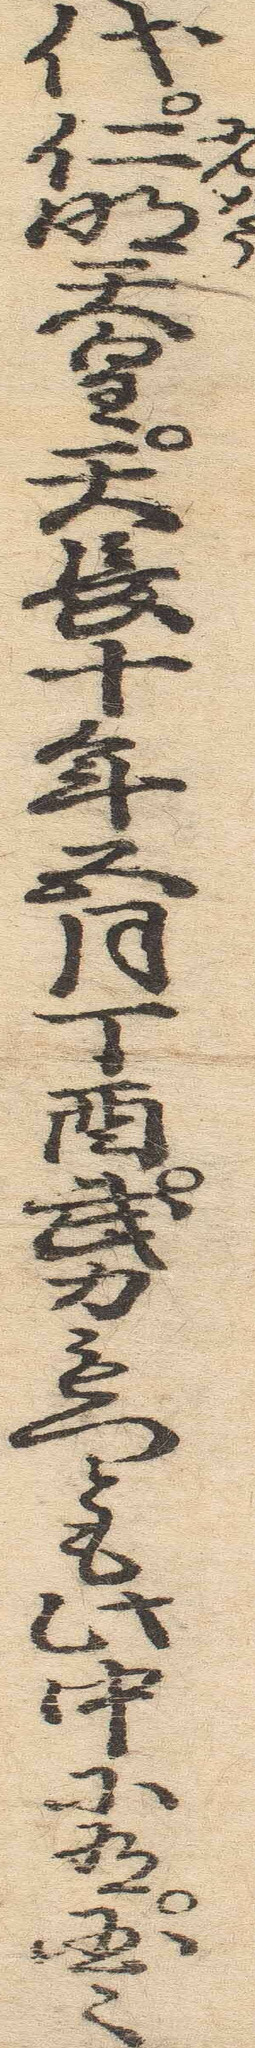代。仁明天皇。天長十年五月丁酉。武力もつとも此中に有。国々
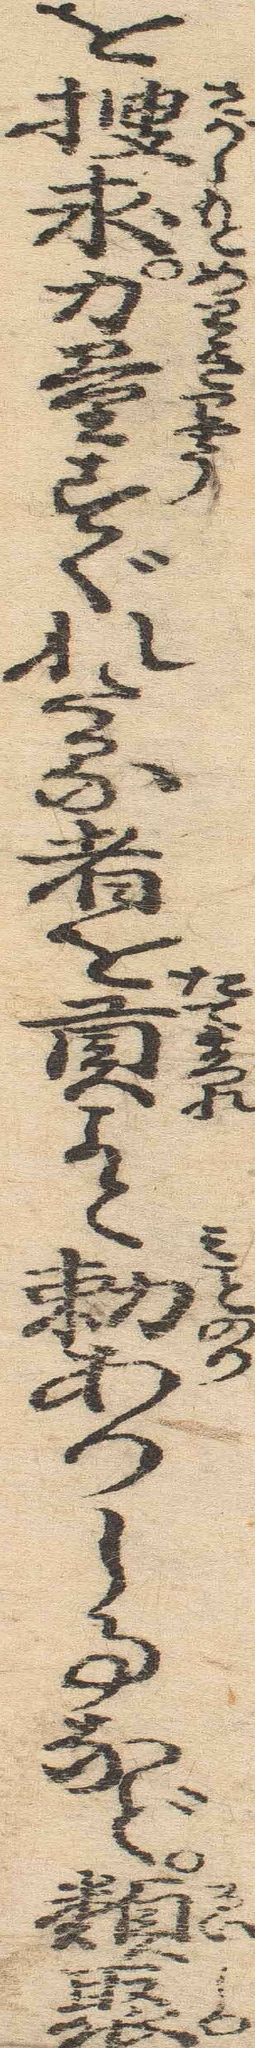を捜求。力量すぐれたる者を貢よと勅ありし事など。類聚
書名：古今相撲大全
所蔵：東京学芸大学附属図書館 国文学研究資料館
